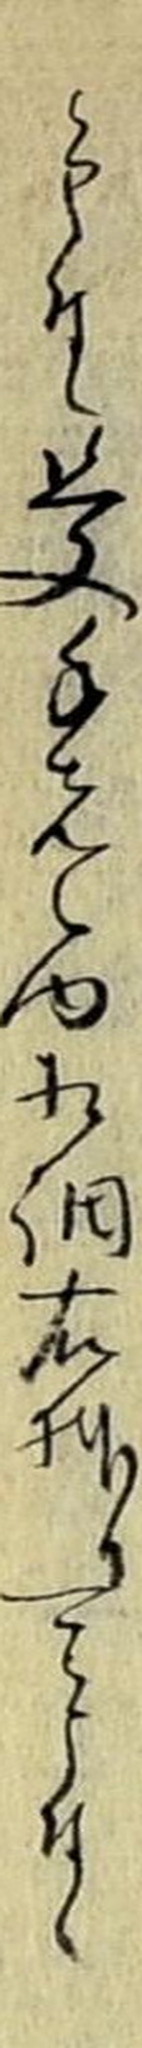被申付候且又手先之内相調右掛り可被申付候
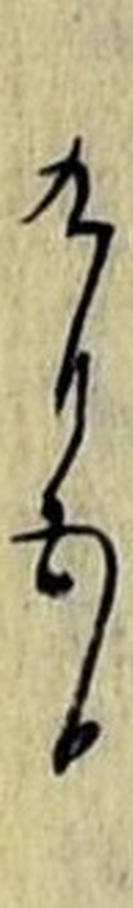九月五日
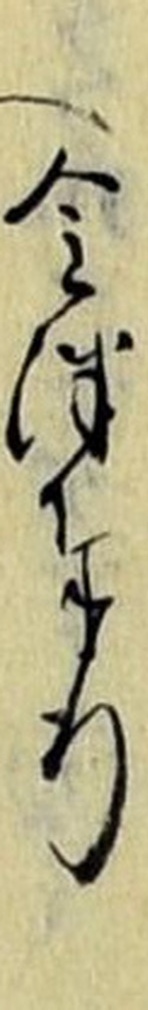金津奉行
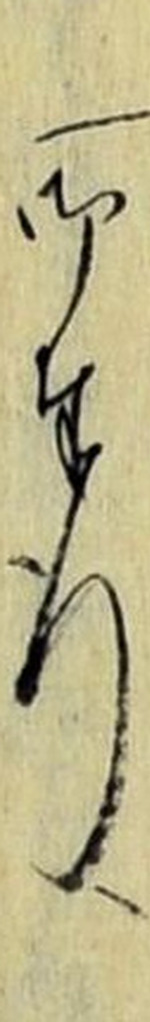御奉行
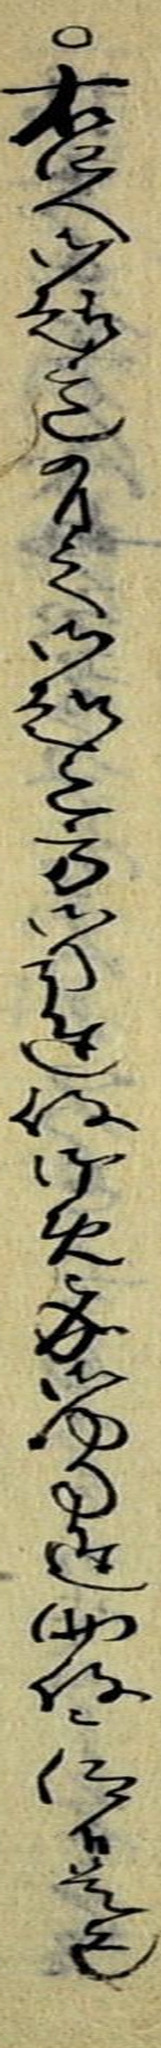○右四人御趣意有之御趣意方御用達役御免被成御内用達助役被仰付是迄
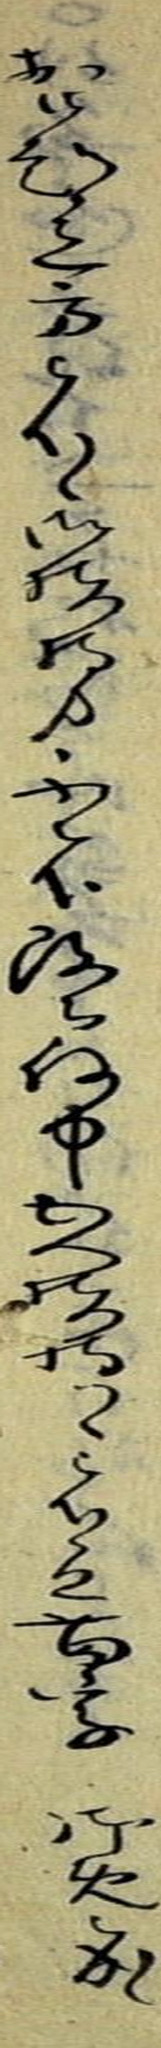於御趣意方被下候御扶持方不被下改而役中五人扶持つヽ被下置苗字御免被成候
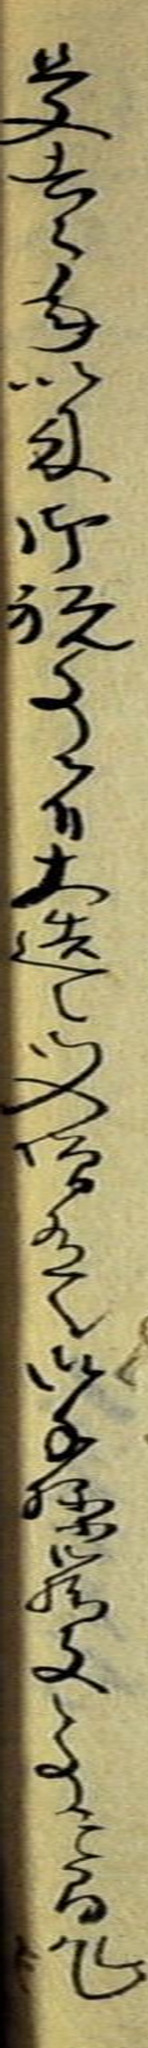且又去々年以来御祝事に付大造之御入増有之御手繰御指支之事に候間乍
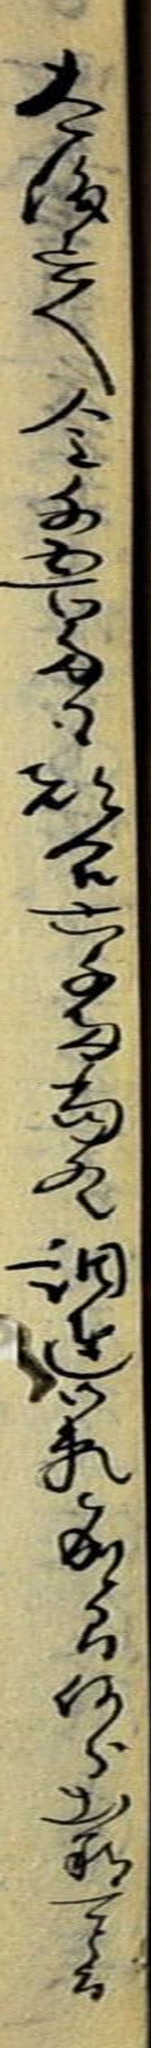大儀壱人金千五百両つヽ都合六千両当冬調達御頼被成候間何分出精可申旨
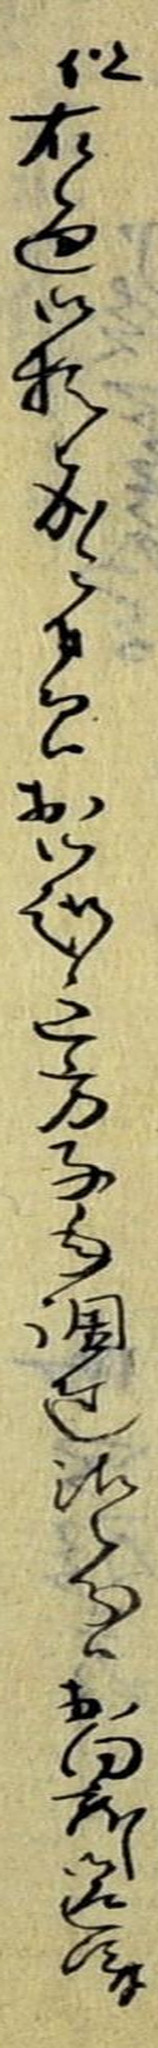但右之通御頼被成候に付而は於御趣意方子年調達銀之分は於同附御返済
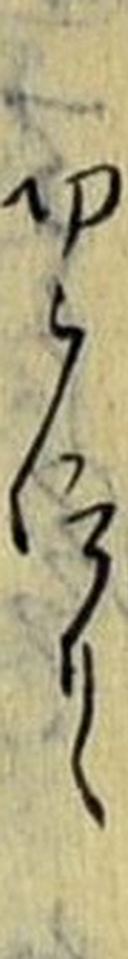切被仰付候
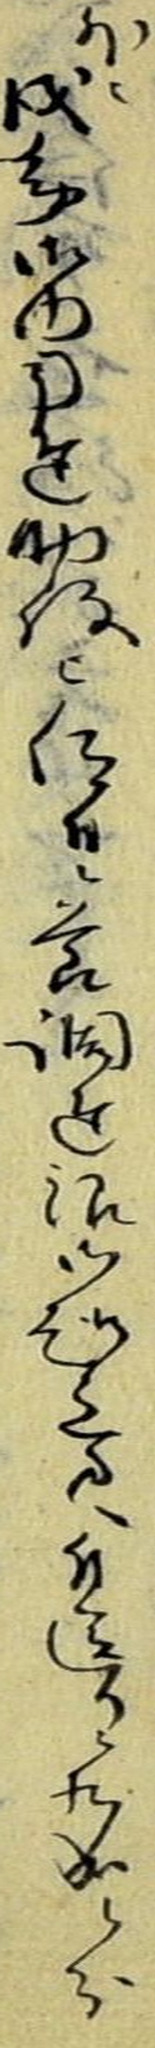戌年御内用達助役被仰付候節調達銀御趣意方へ付送りに相成候分
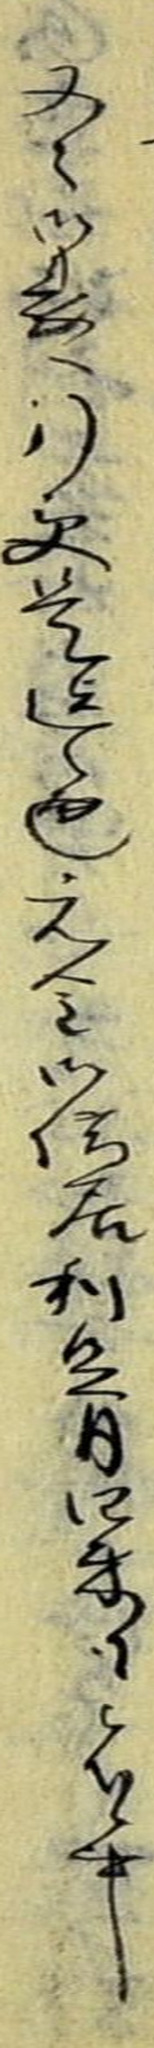又々御表へ引受是迄之通元金御借居利足月四朱つヽ被下候事
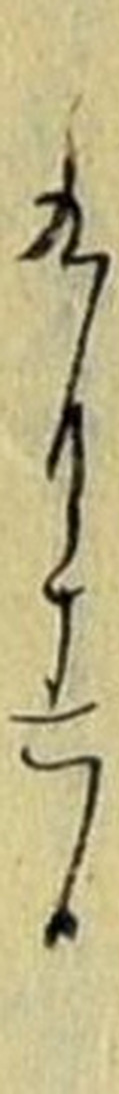九月十六日

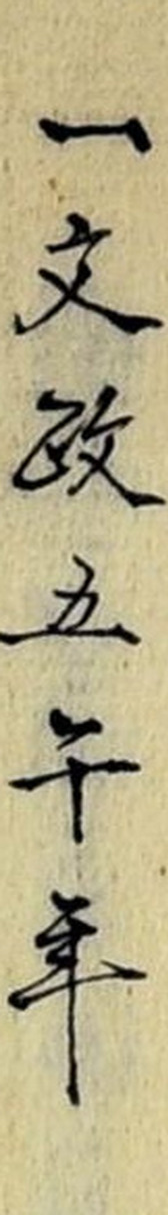一文政五午年
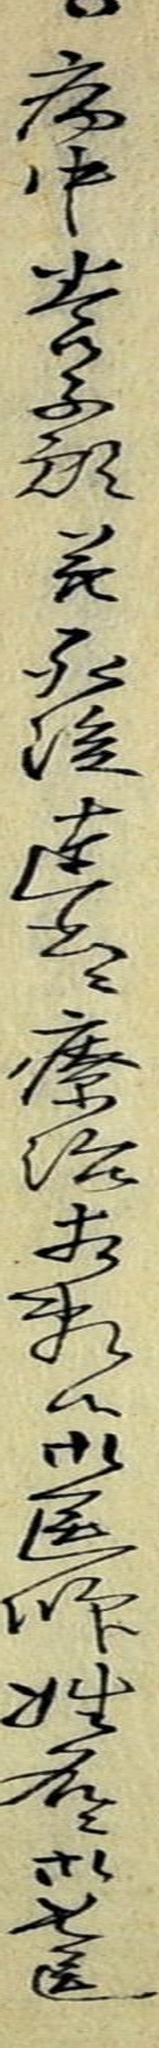○病中養子願并死後達書に療治相頼候御医師姓名に御匕医
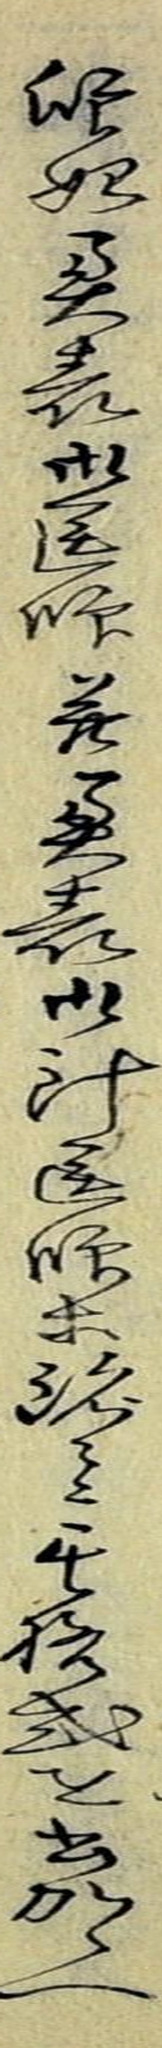師始奥表御医師并奥表御針医師等銘々に其格式を書加候へ
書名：命令之部 四
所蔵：福井県文書館 Fukui Prefectural Archives
